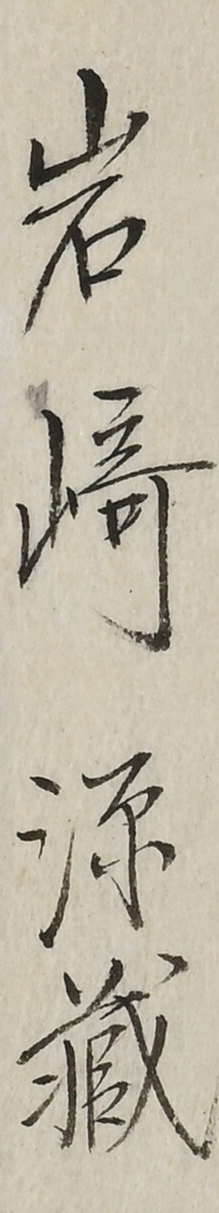岩崎源蔵
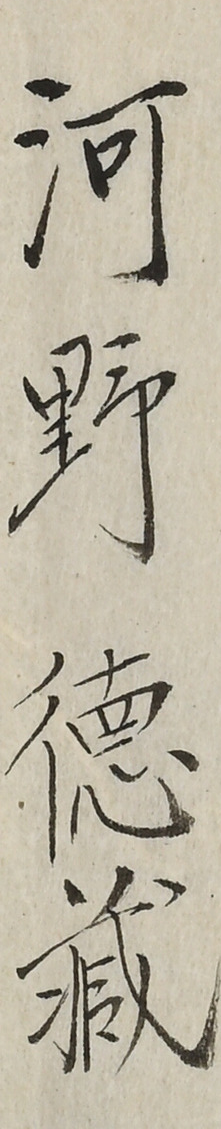河野徳蔵
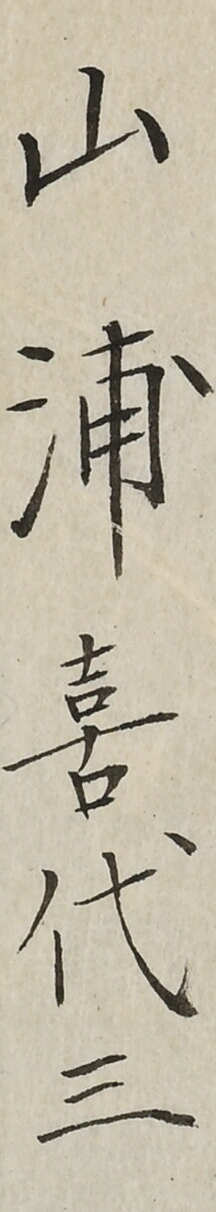山浦喜代三
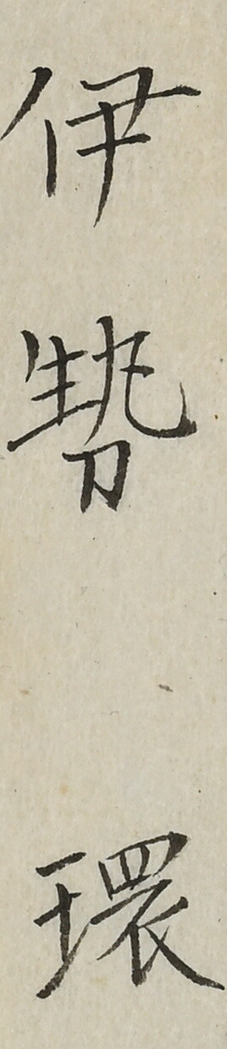伊勢環

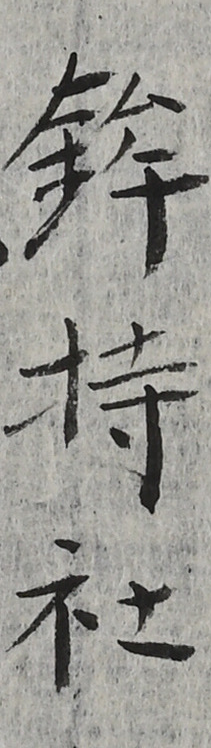鉾寺社

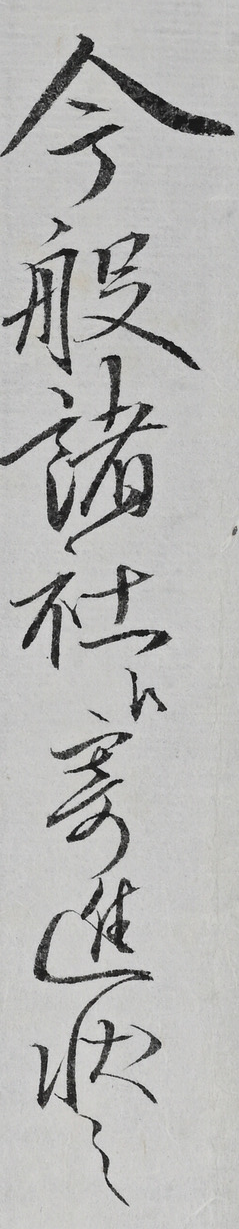今般諸社江寄進状之
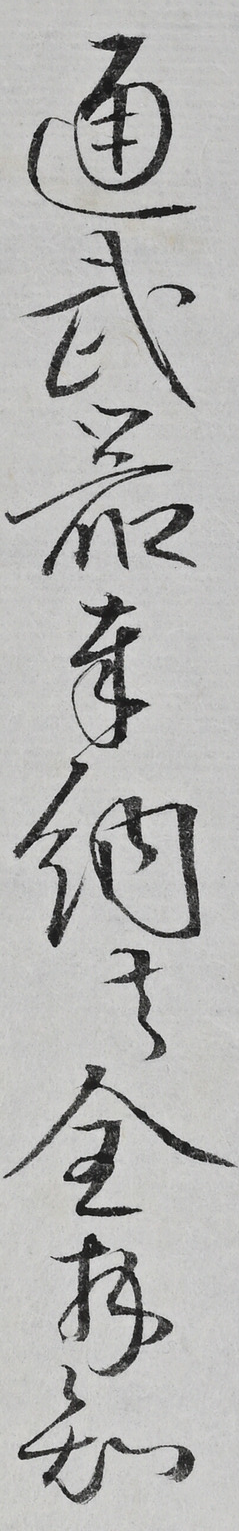通武器奉納は全拝知
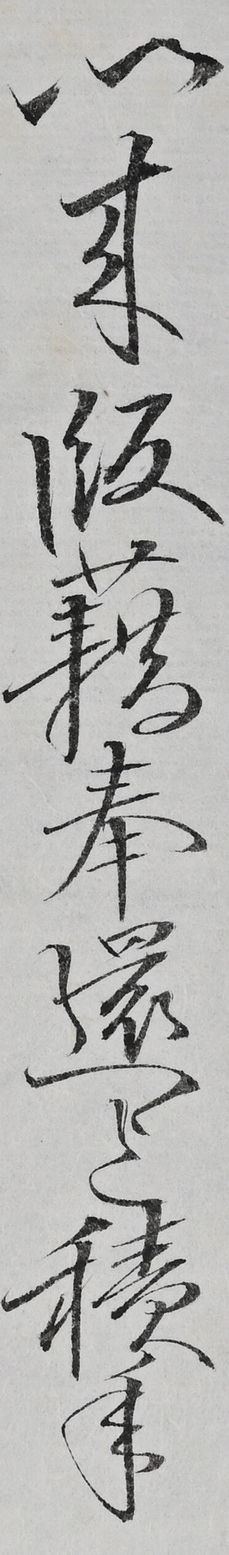以来版籍奉還迄積年
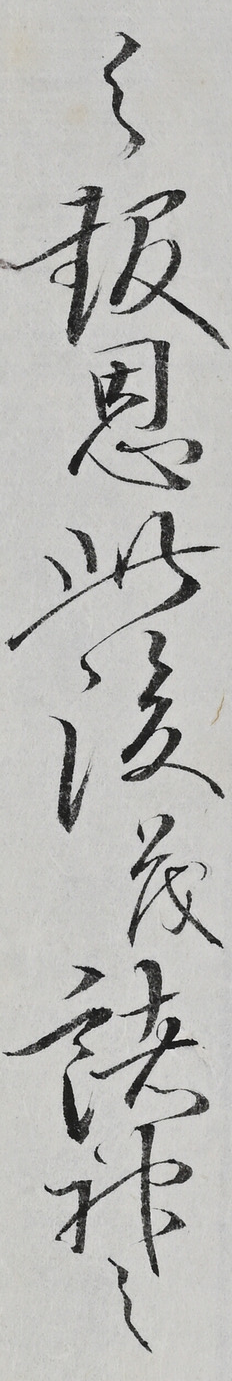之報恩此後茂諸神之
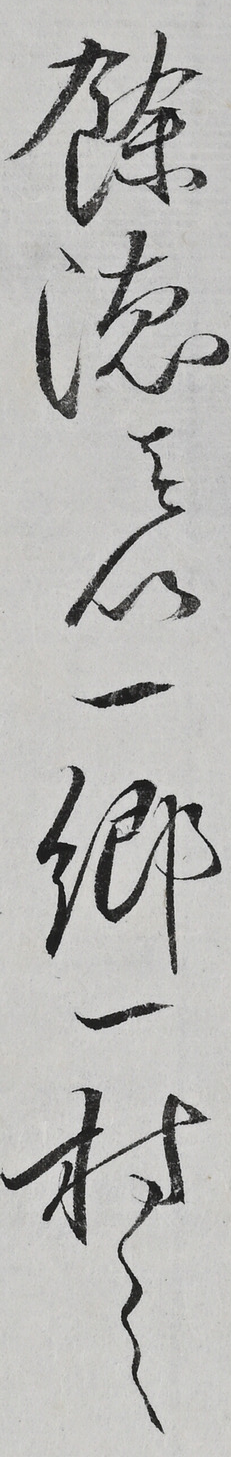餘徳を以一郷一村之
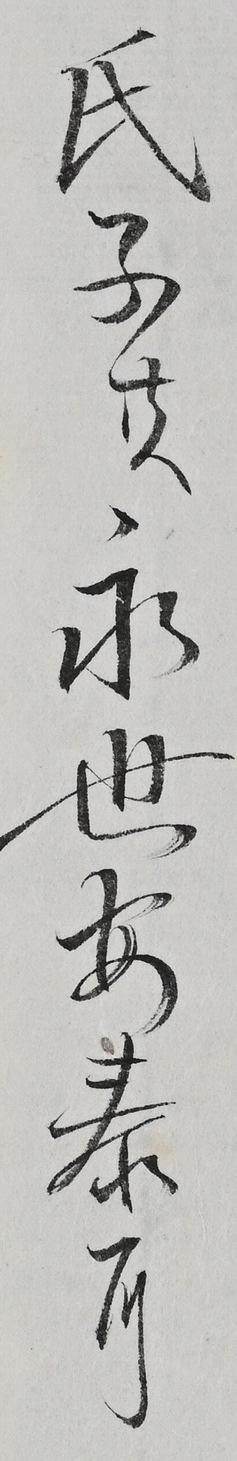氏子共永世安泰に
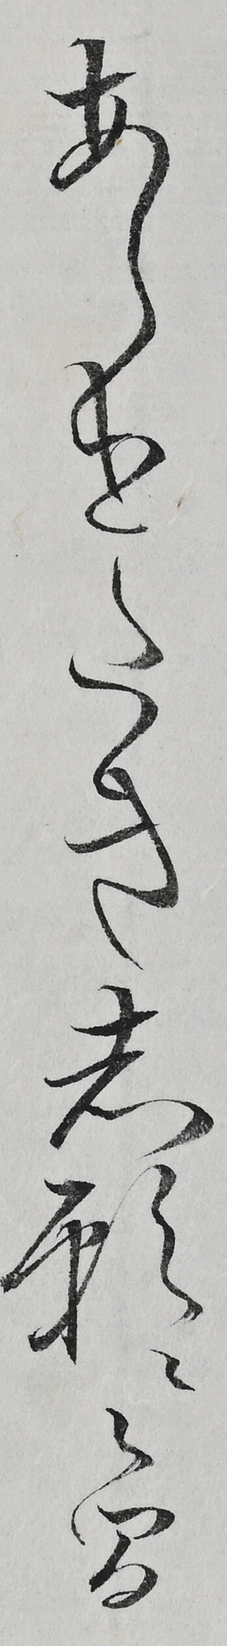あられたき志願ニ候間
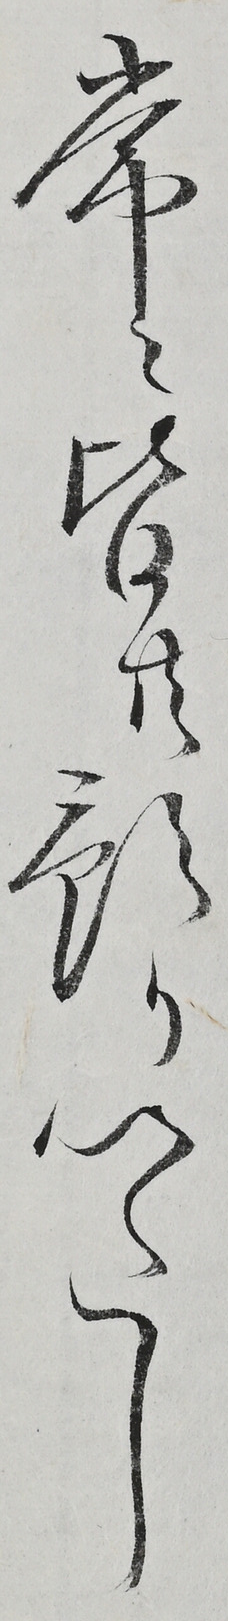常々皆共預りいたし
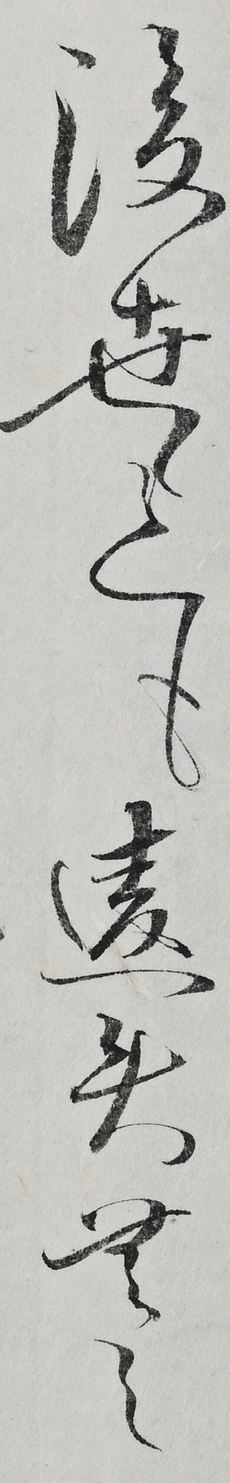後世迄も違失無之
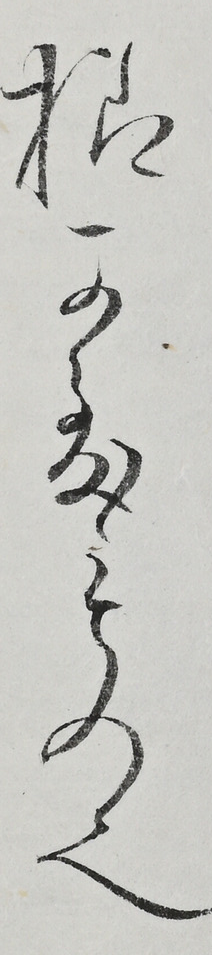様可致もの也
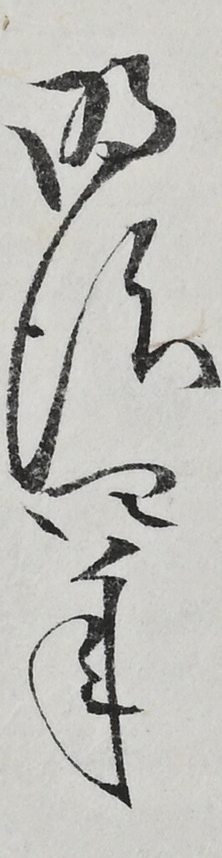明治四年
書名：記
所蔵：伊那市立高遠町図書館・合同会社AMANE
